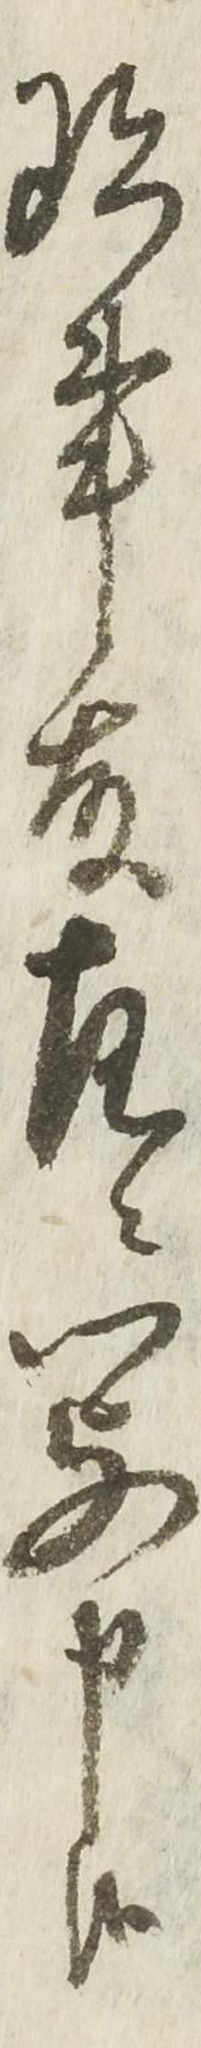珍事故左ニ写申候
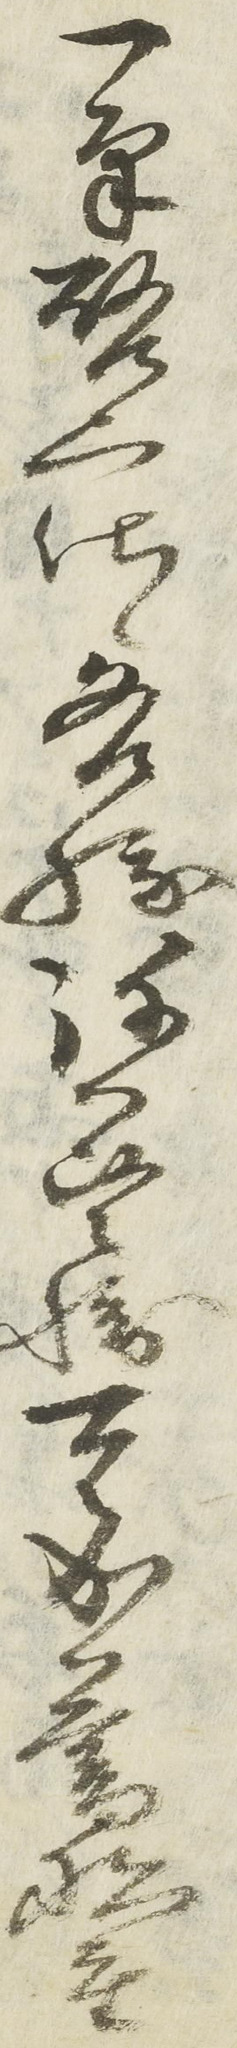一筆啓上仕候各様弥御豊勝可被成御暮珍重
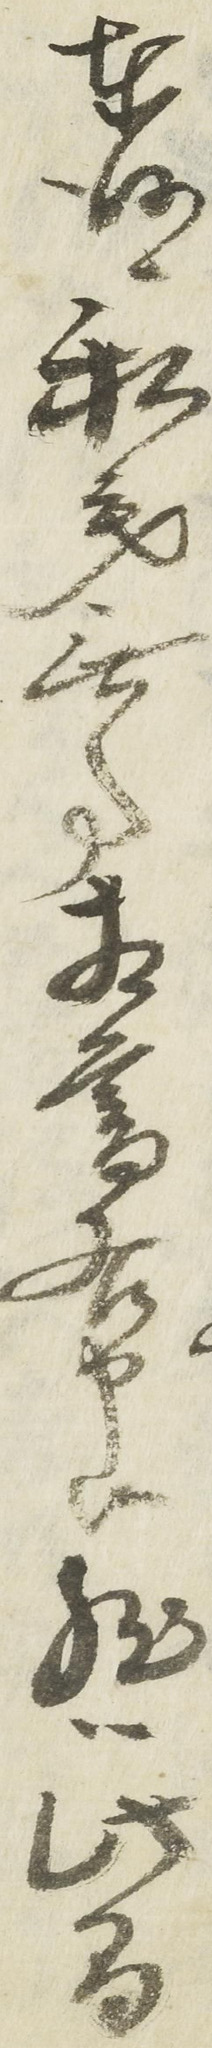奉存候私義無事相暮居申候然は此間
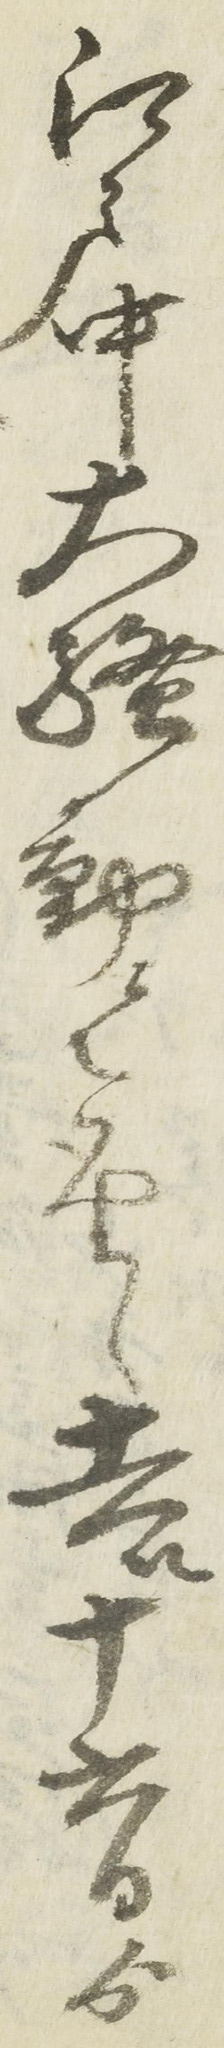江戸中大騒動ニて御座候去ル十六日ゟ
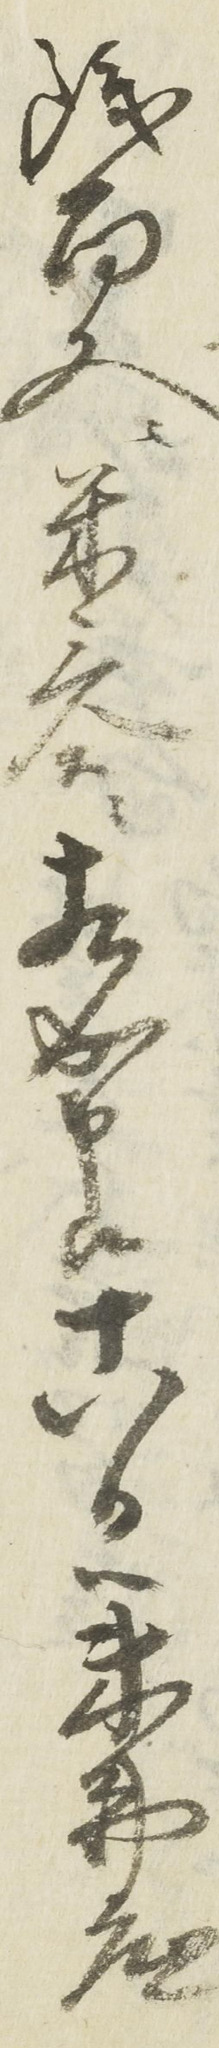銭百文ニ米三合ニ相成申候十八日は米払底
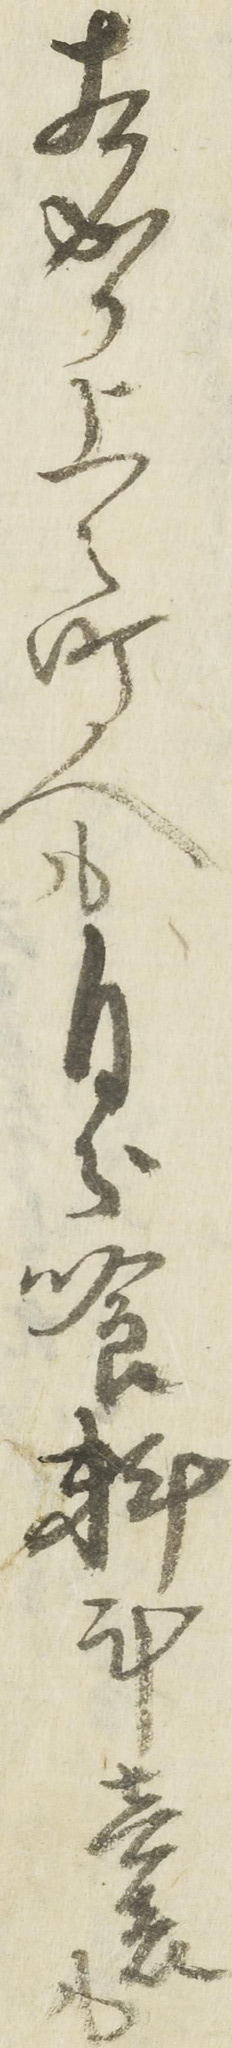相成り上之町人も自分喰料計壱表も
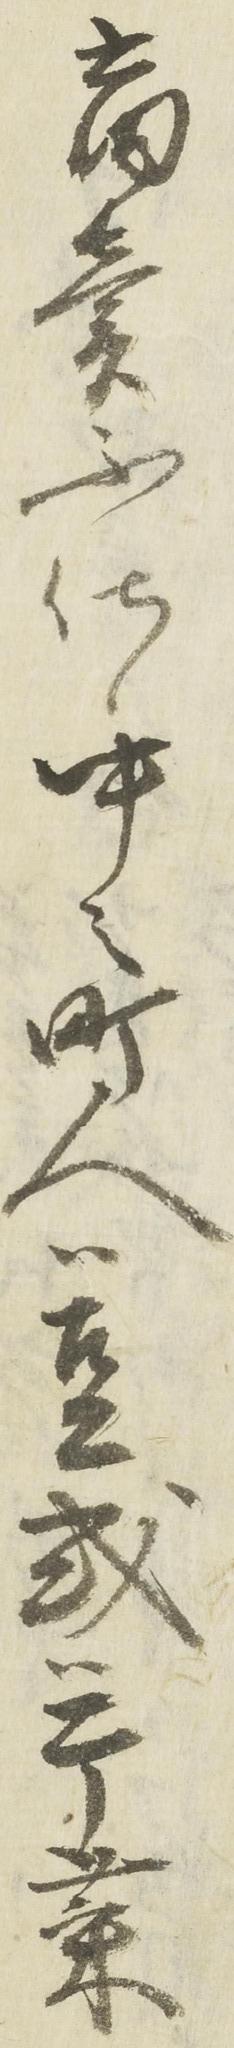商売不仕候中之町人は豆或は干菜
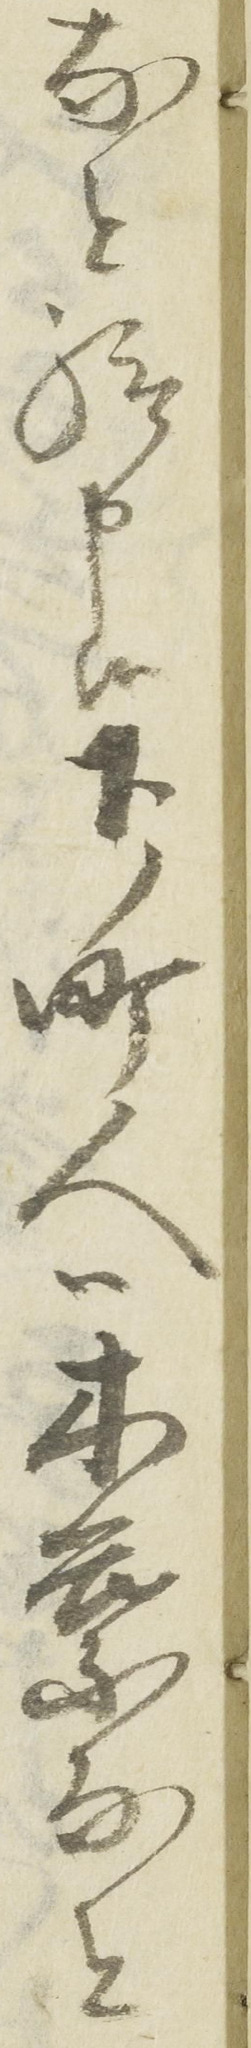なと給申候下ノ町人は木葉なと
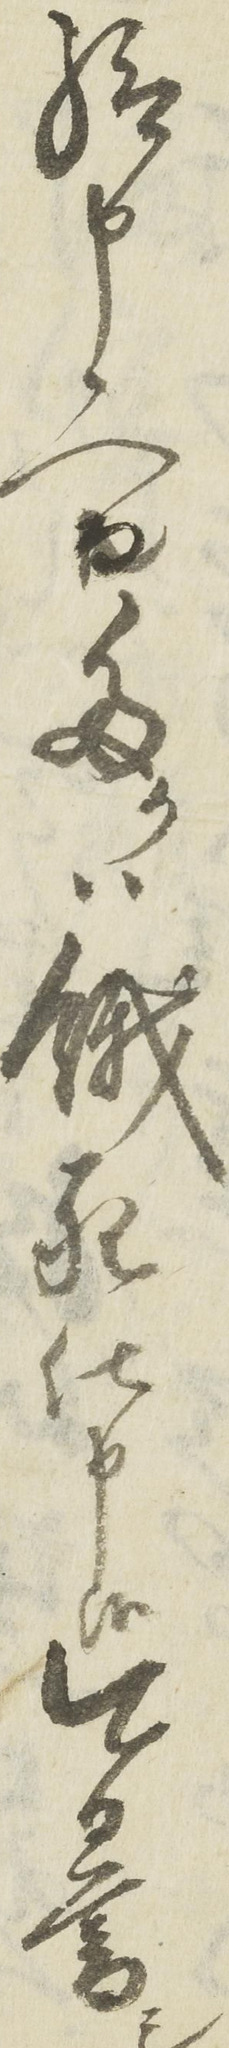給申候へ共多くは餓死仕申候今日暮シ
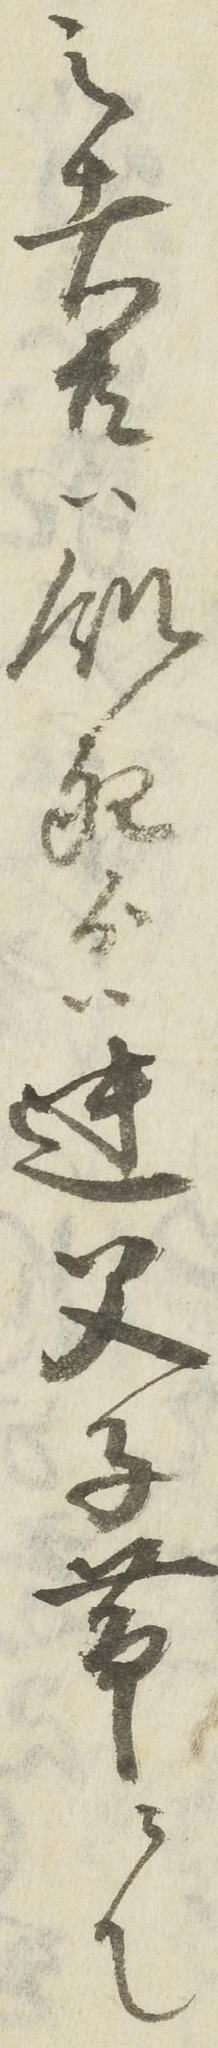之者共は飢死ゟは迚父子帯ニて
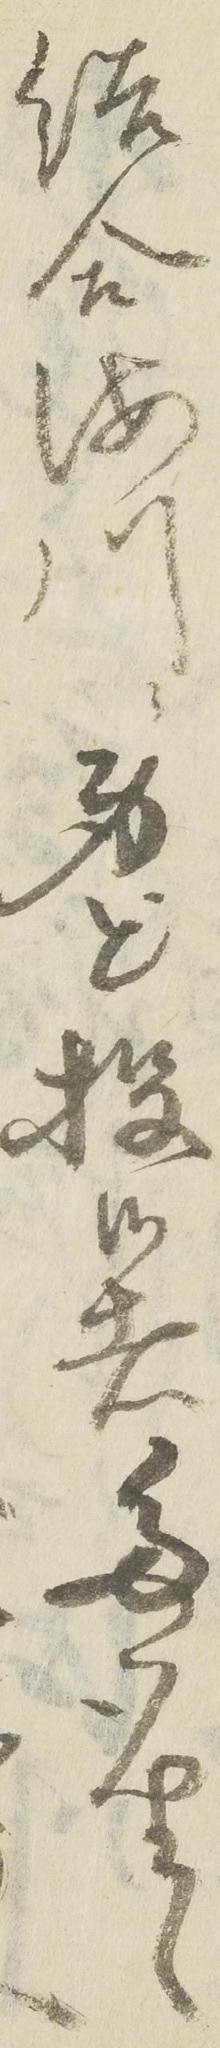結合海川ニ身を投候者多御座候
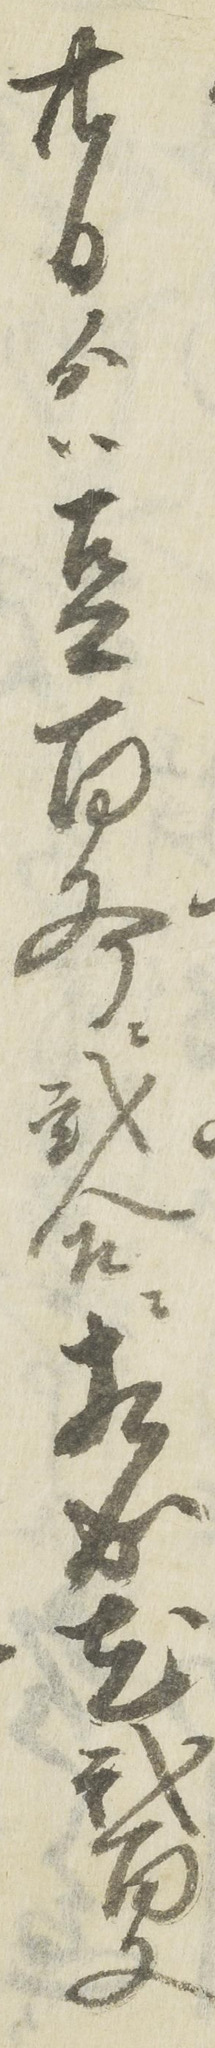廿日ゟは豆百文ニ弐合ニ相成尤弐百文
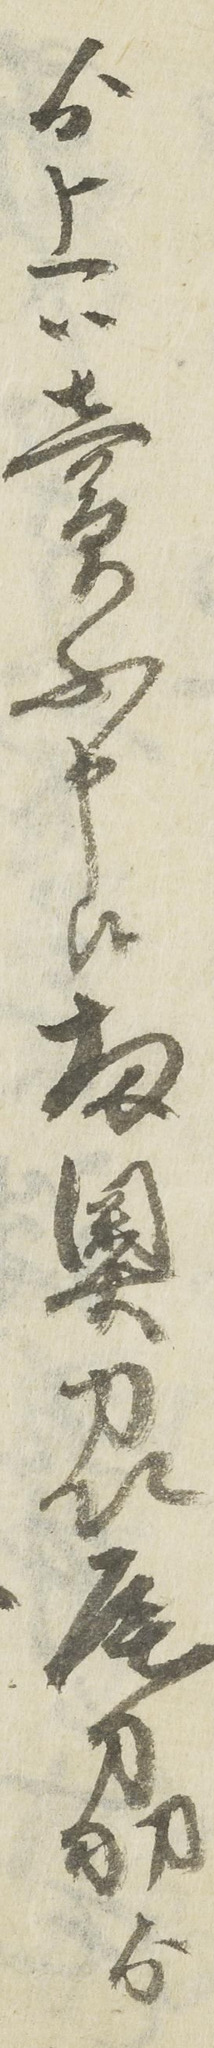ゟ上は売不申候扨奥州尾州ゟ
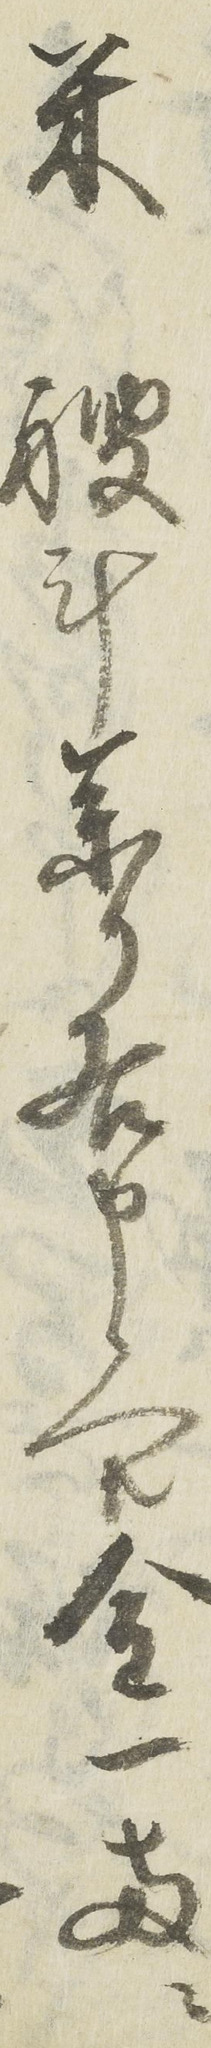米艘計参り居申候へ共金一両ニ
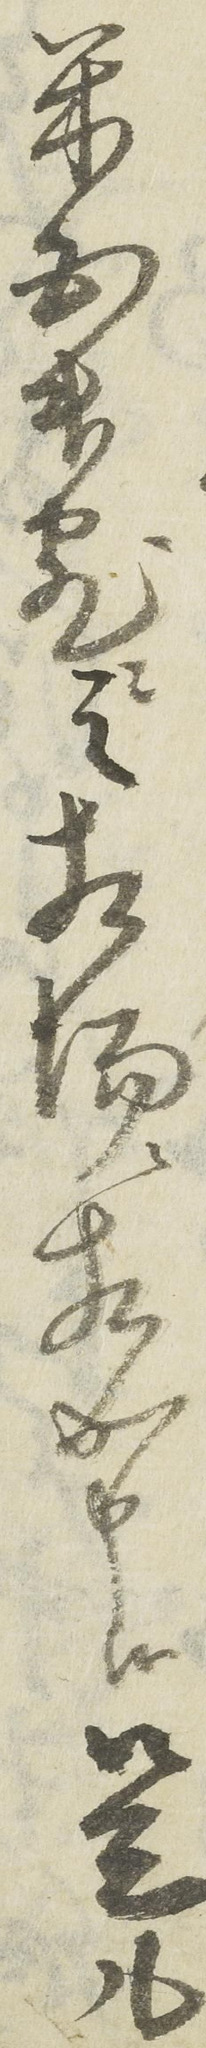米五斗歟ニ之相場ニ相成申候是も
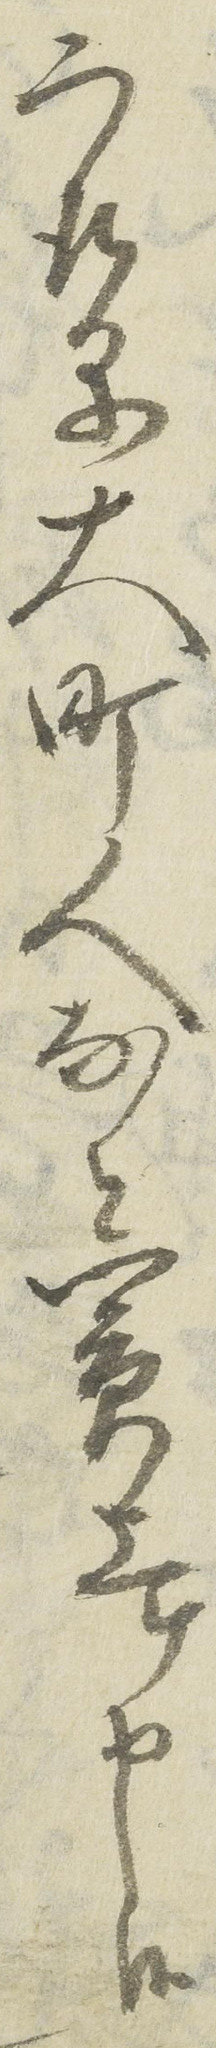最早大町人なと買上ケ申候
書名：後見笑
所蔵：東京大学地震研究所図書室 Earthquake Research Institute Library, The University of Tokyo, JAPAN
